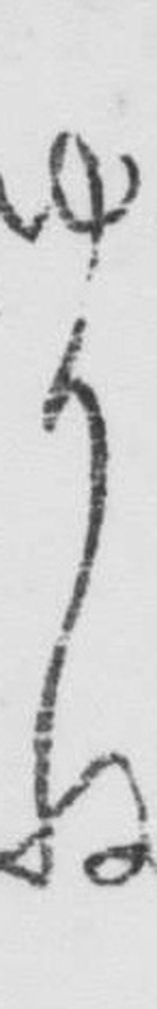ゆりね
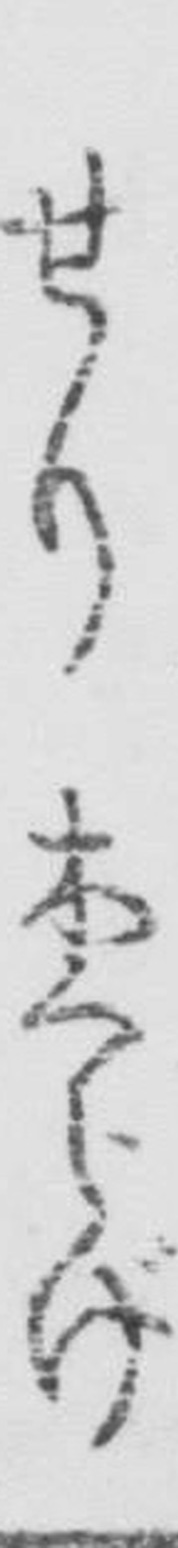せり木くらげ
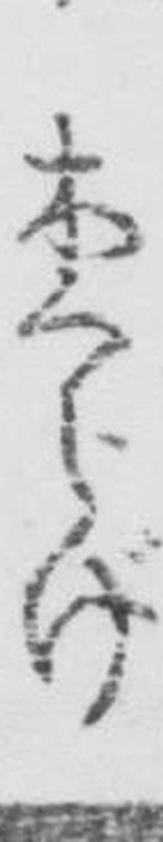木くらげ
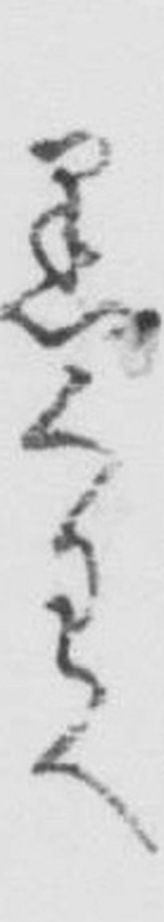黒くわへ
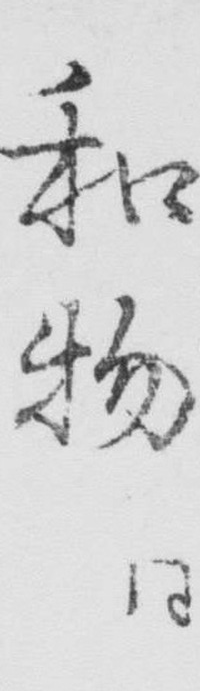和物同
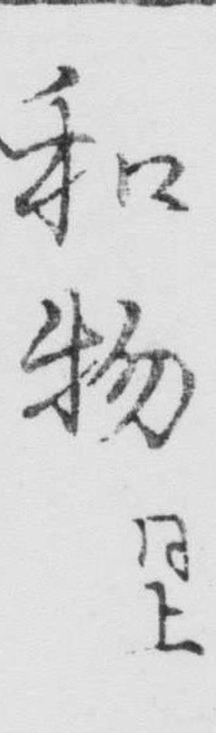和物同上
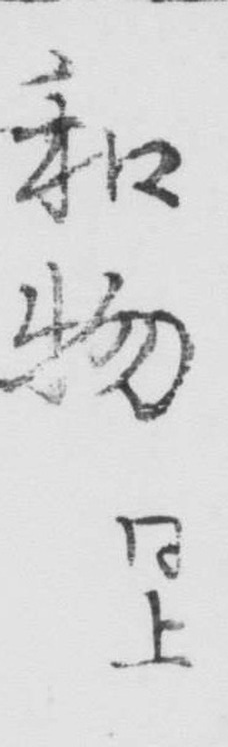和物同上
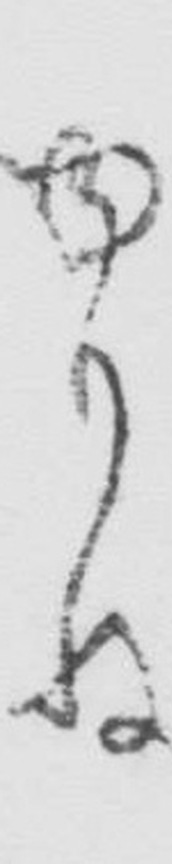ゆりね
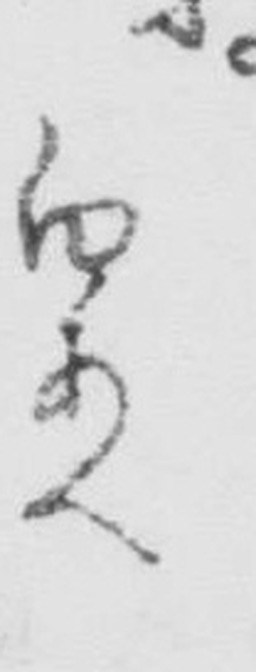白あへ
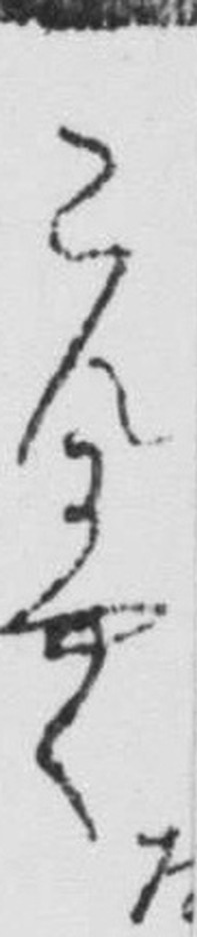こんにやく
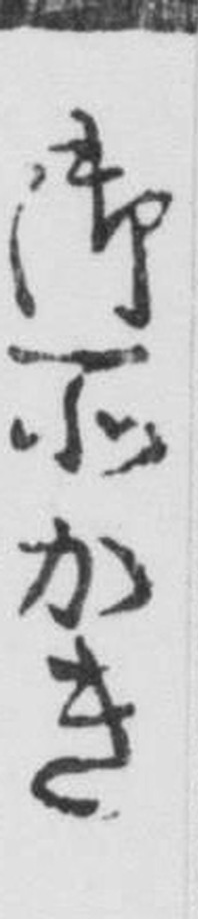御所かき
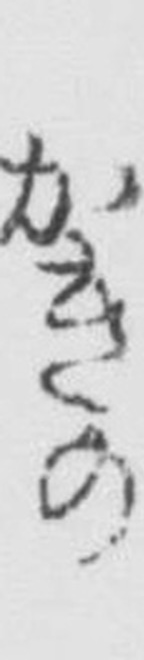かきの
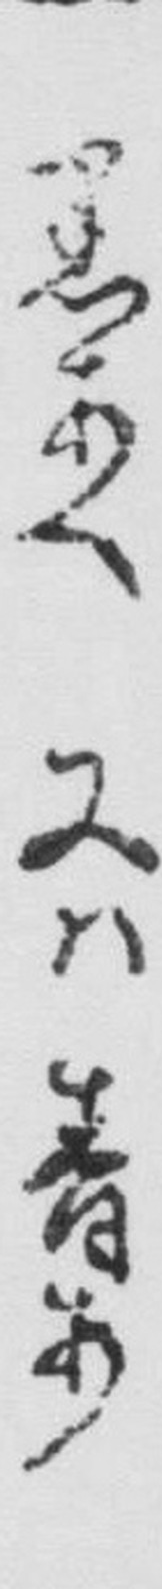黒あへ又は青あへ
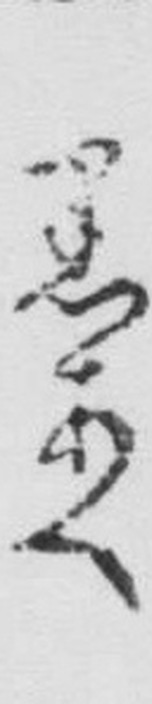黒あへ
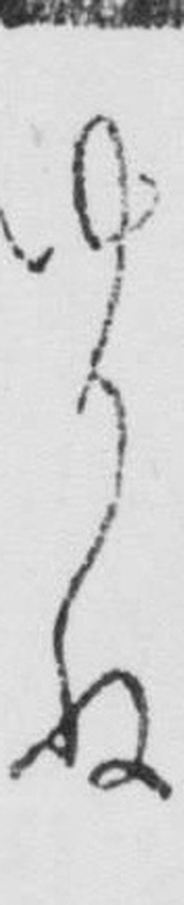ゆりね
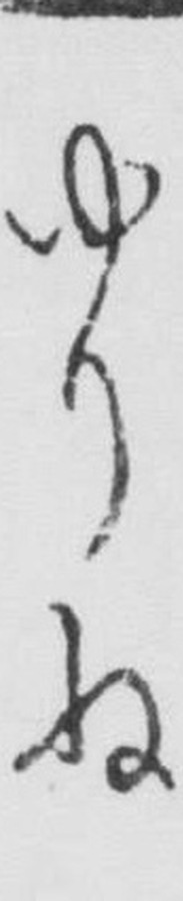ゆりね
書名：諸家通用/即席料理
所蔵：大阪府立大学学術情報センター 国文学研究資料館
